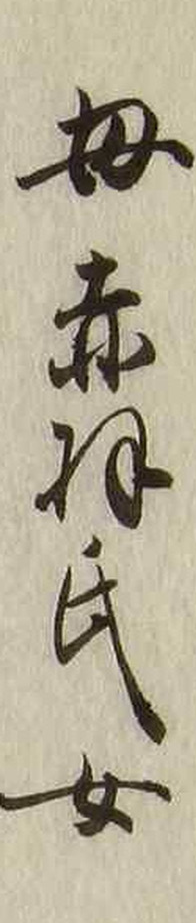母赤羽氏女
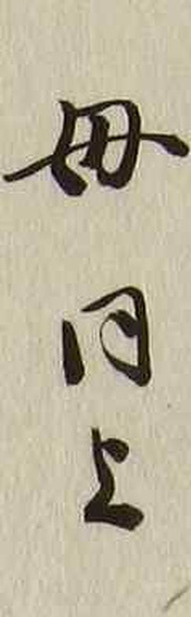母同上
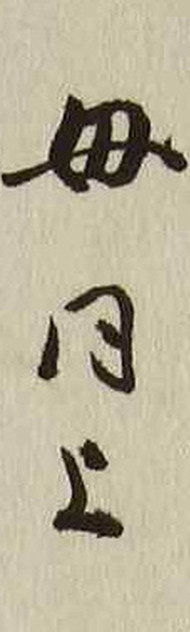母同上
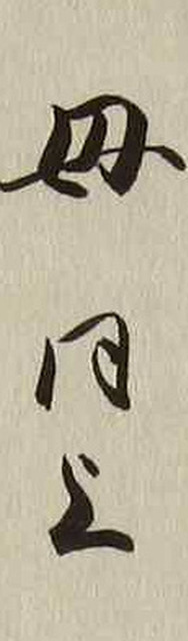母同上
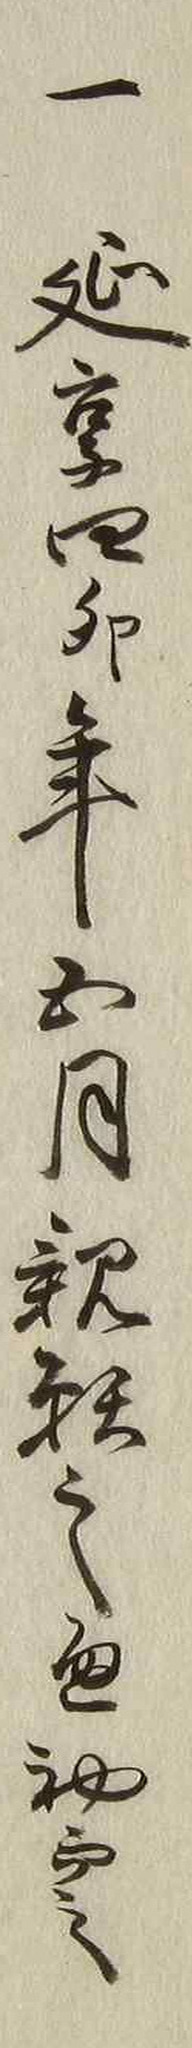一延享四卯年五月親願之通初而之
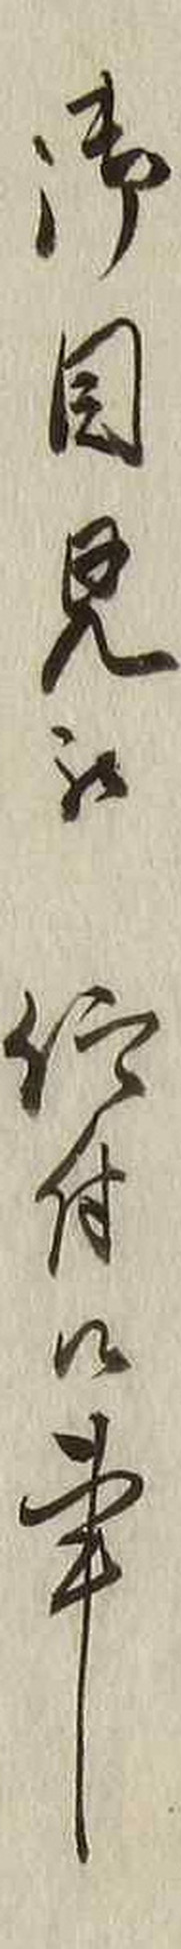御目見被仰付候事
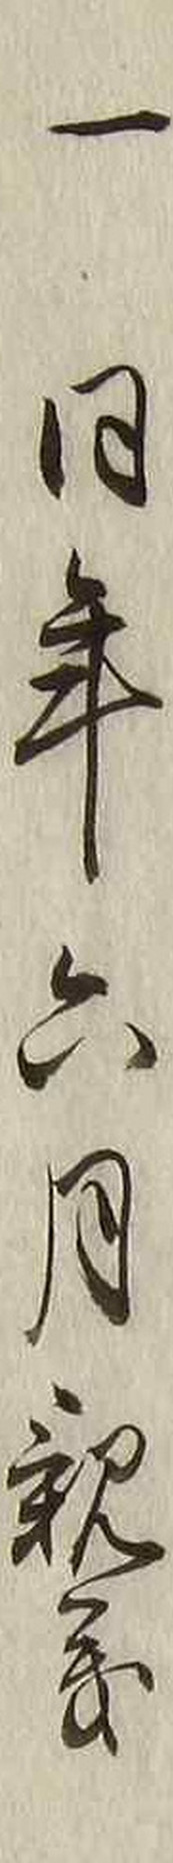一同年六月親義
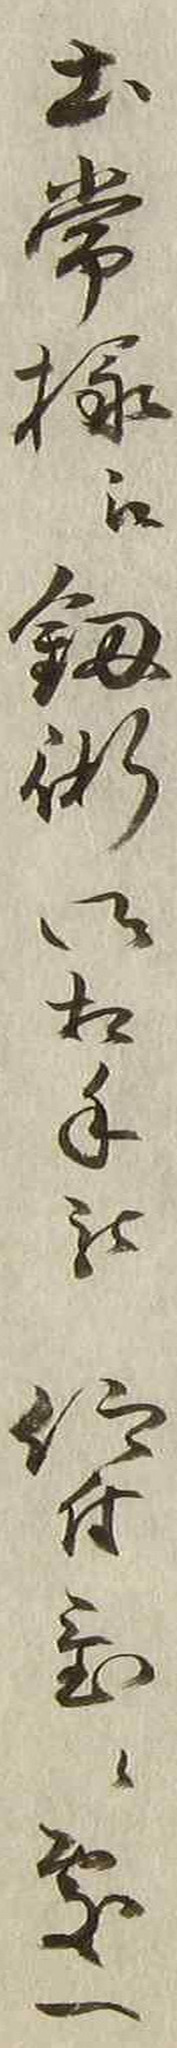土常様江剣術御相手被仰付置候処一
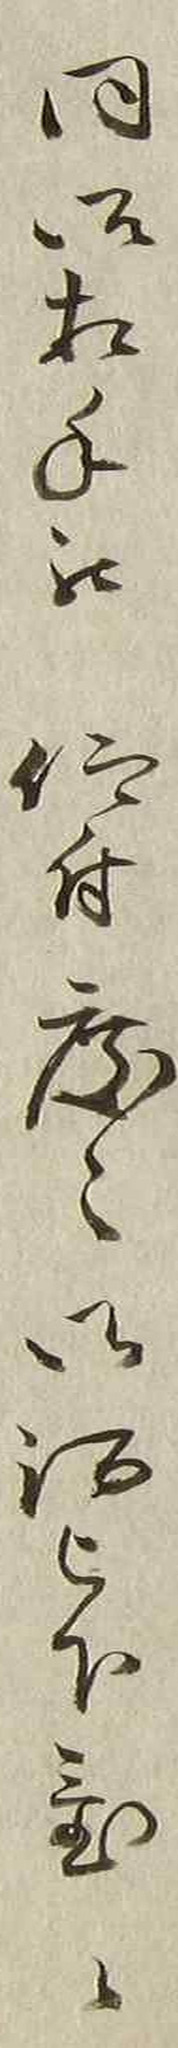同御相手被仰付度々御酒被下置候
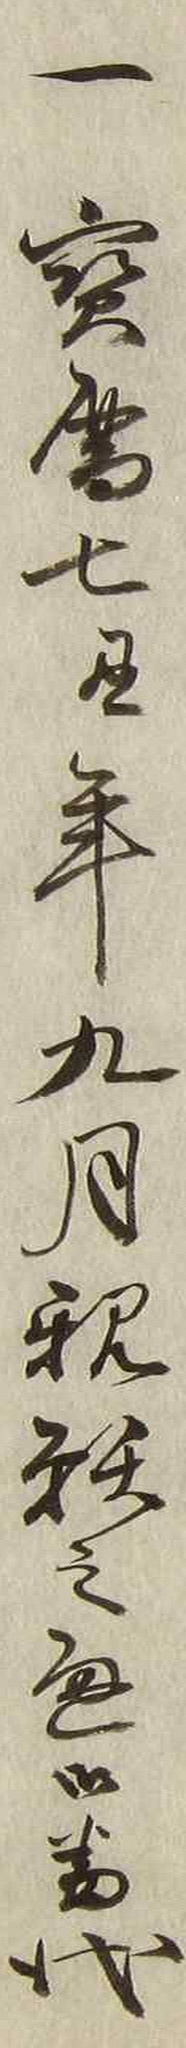一宝暦七丑年九月親願之通御番代

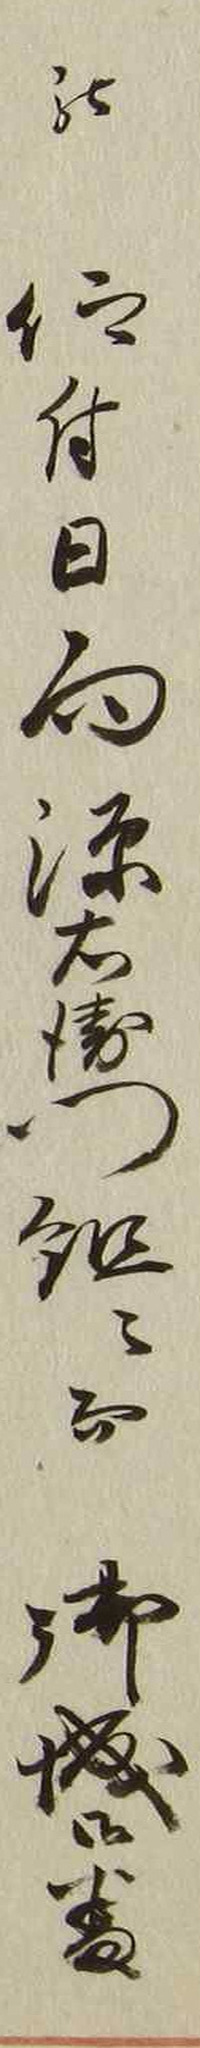被仰付日向源右衛門組ニ而御城御番
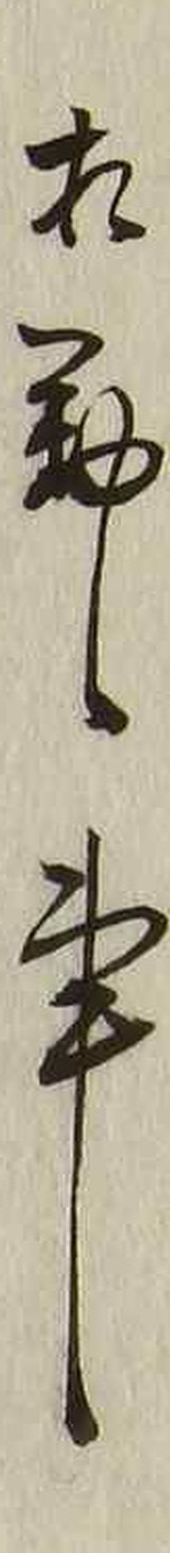相勤候事
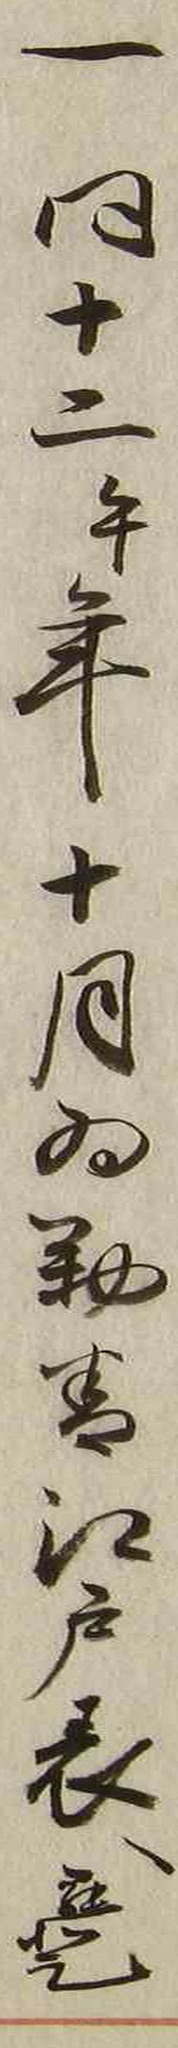一同十二午年十月為勤番江戸表へ罷登
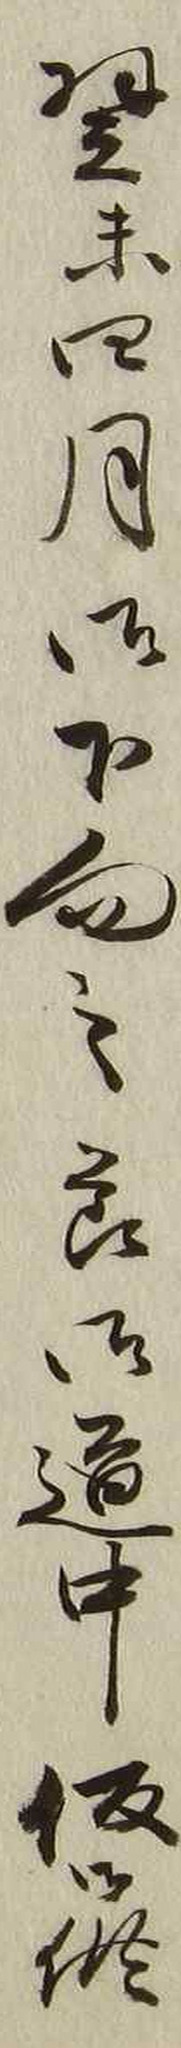翌未四月御下向之節御道中仮御供
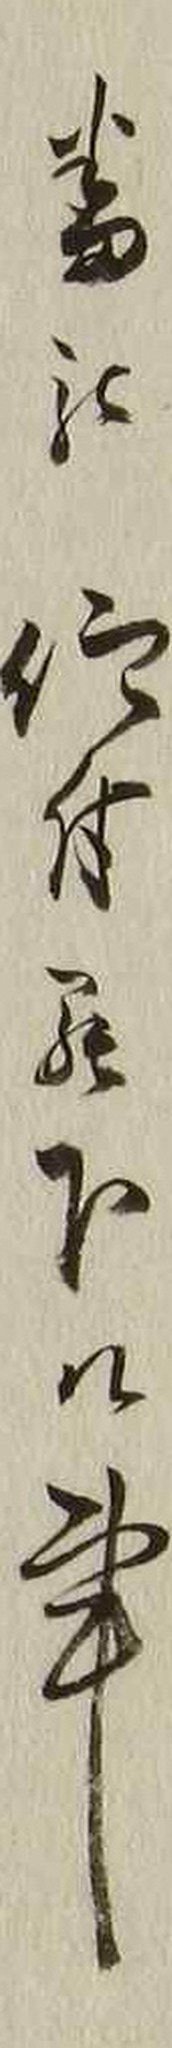番被仰付罷下候事
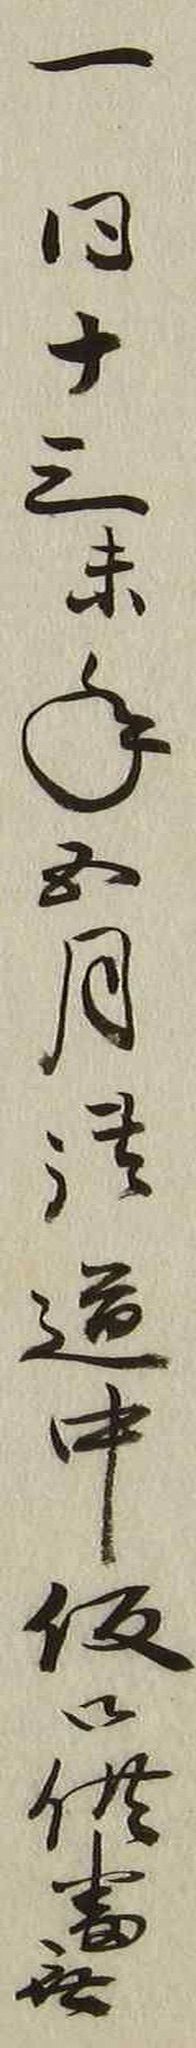一同十三未年五月御道中仮御供番無
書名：諸士系譜　巻之15　い之部15
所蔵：会津若松市立会津図書館
